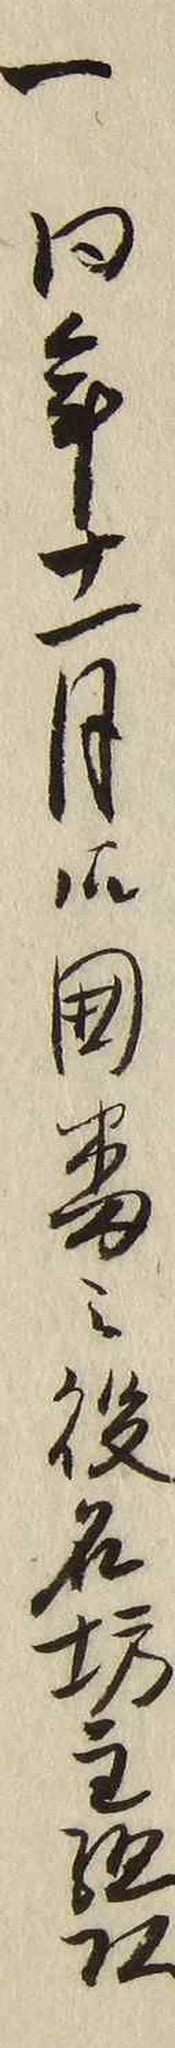一同年十一月御囲番之役名坊主組頭

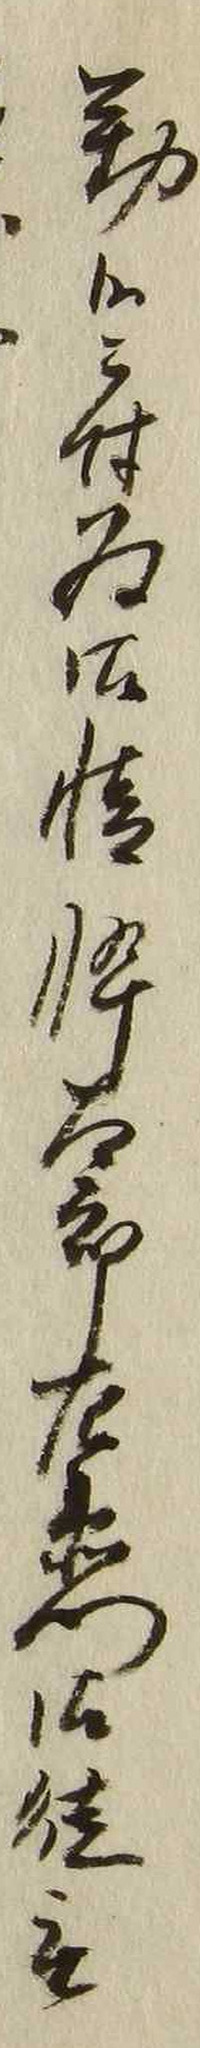勤候ニ付為御情忰太郎左衛門御徒被
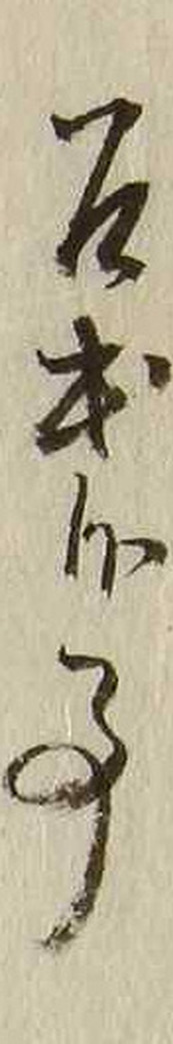召出候事
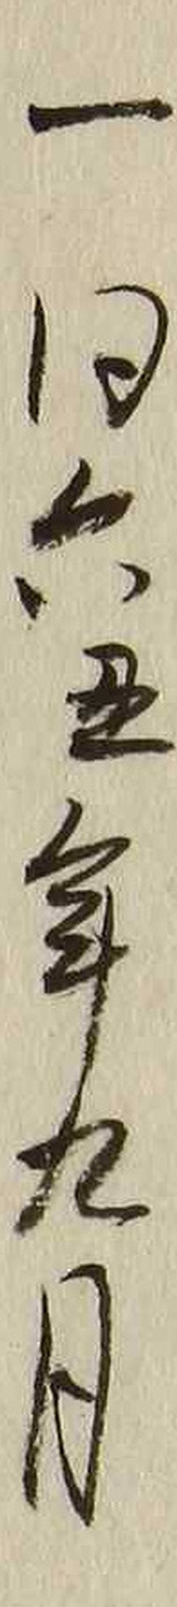一同六丑年九月
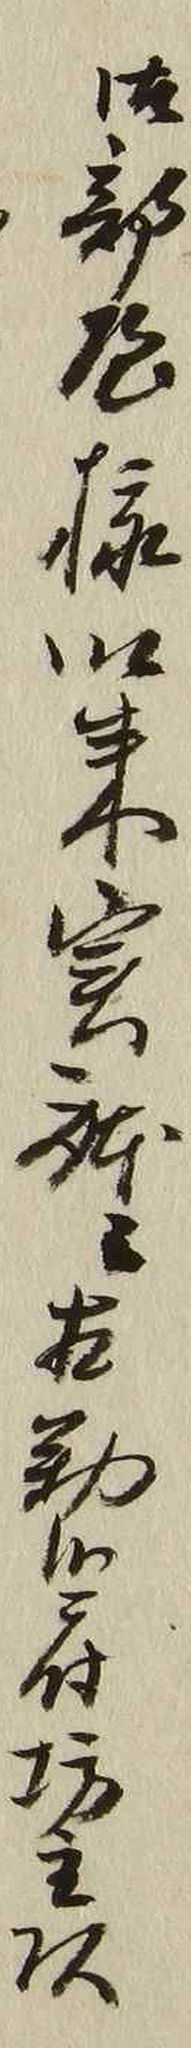御部屋様以来実体ニ相勤候ニ付坊主頭
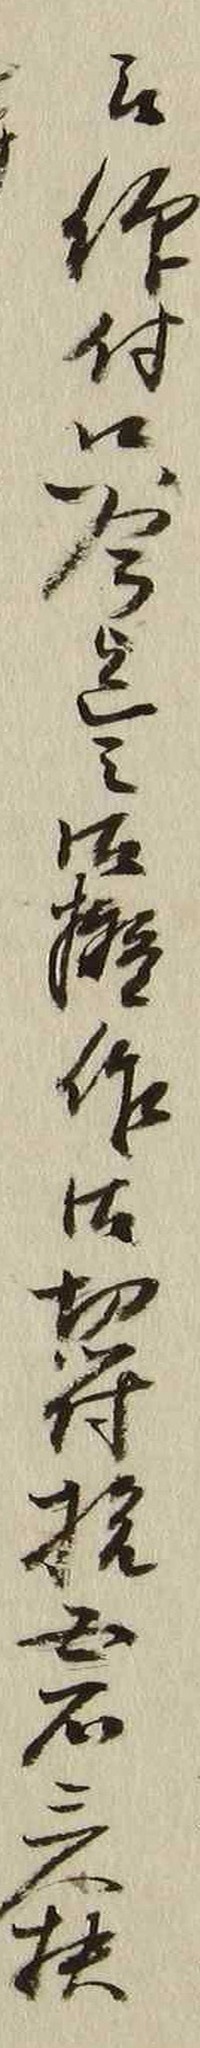被仰付只今迄之御擬作御切符拾五石三人扶
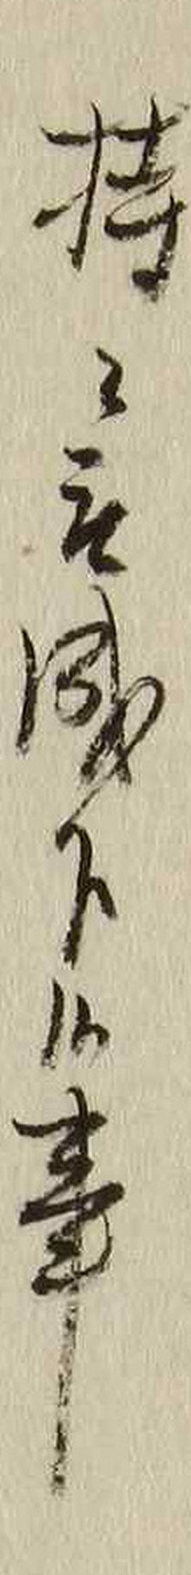持ニ被成下候事
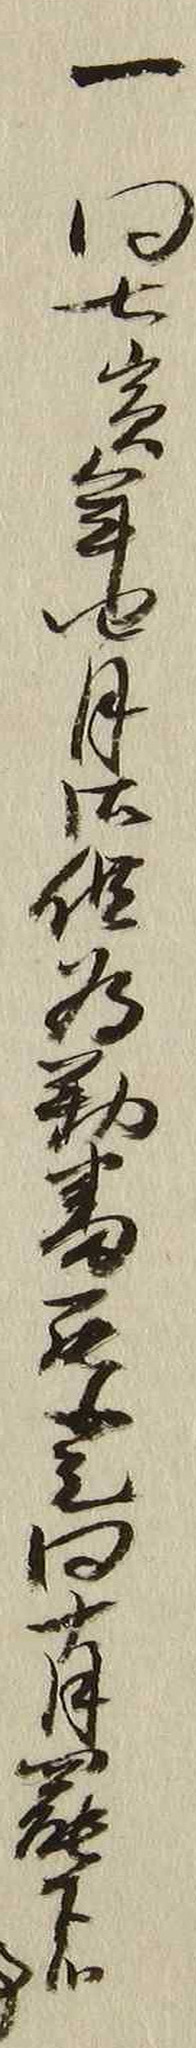一同七寅年四月御供為勤番罷登同十月罷下候事
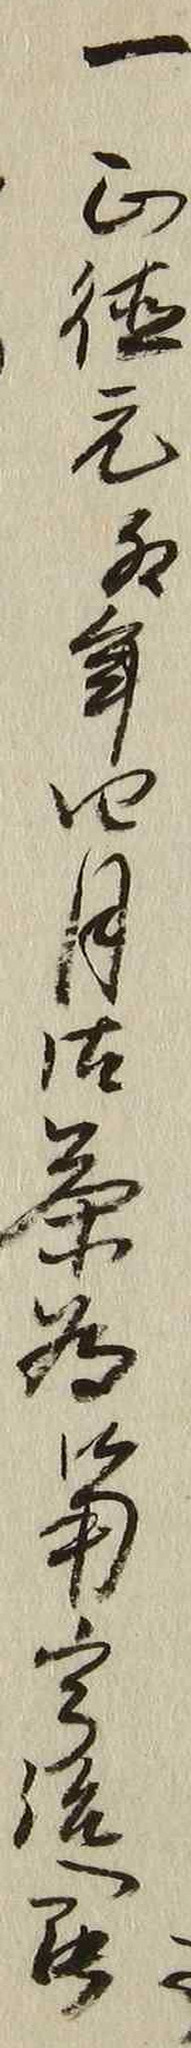一正徳元卯年四月御茶為御用宇治へ罷
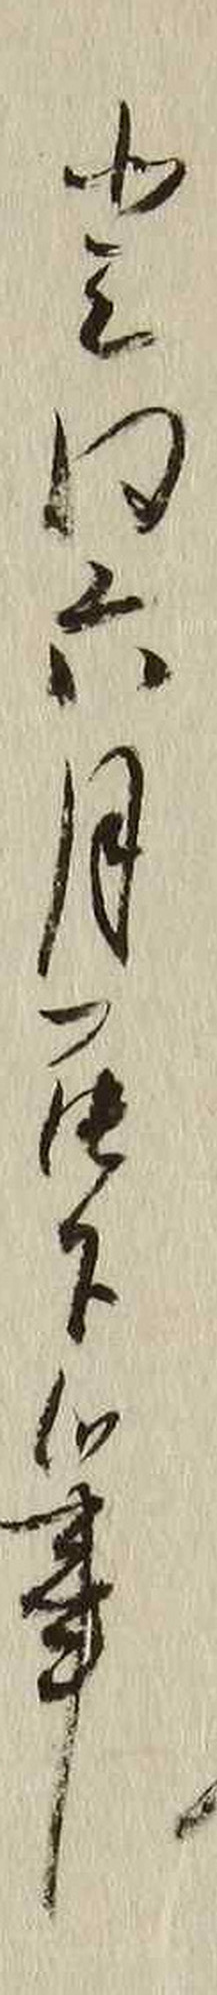登同六月罷下候事
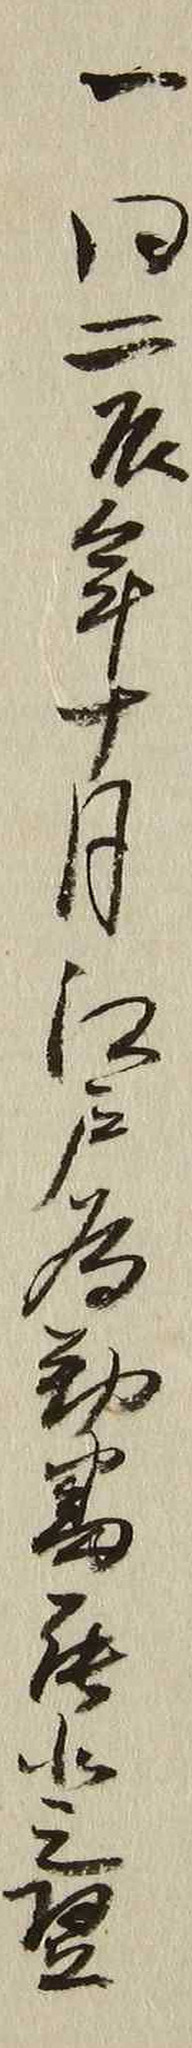一同二辰年十月江戸為勤番罷登翌
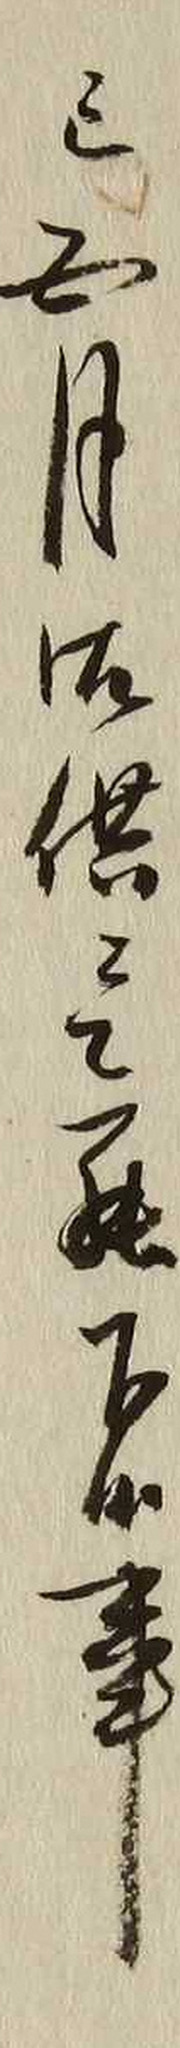巳五月御供ニて罷下候事
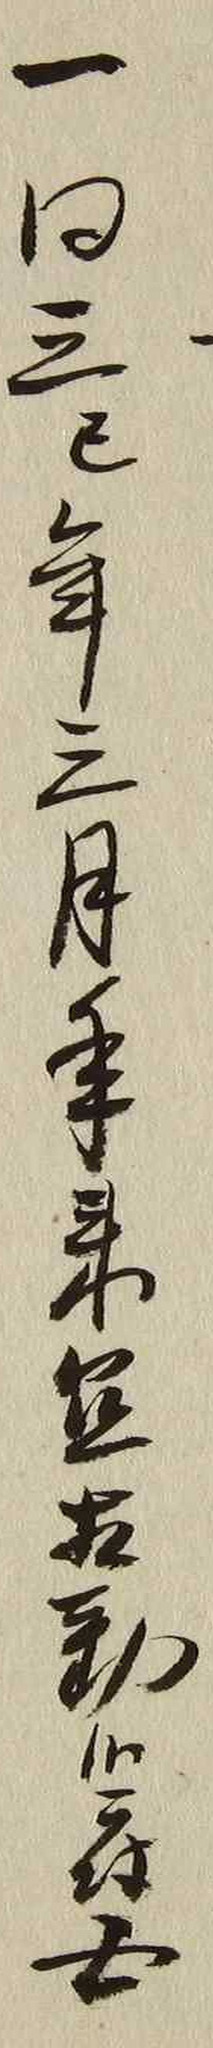一同三巳年三月年来宜相勤候ニ付五
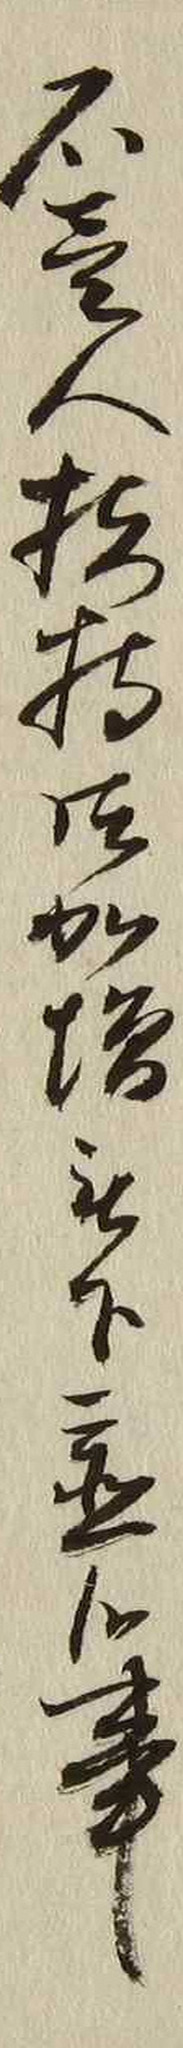石壱人扶持御加増被下置候事
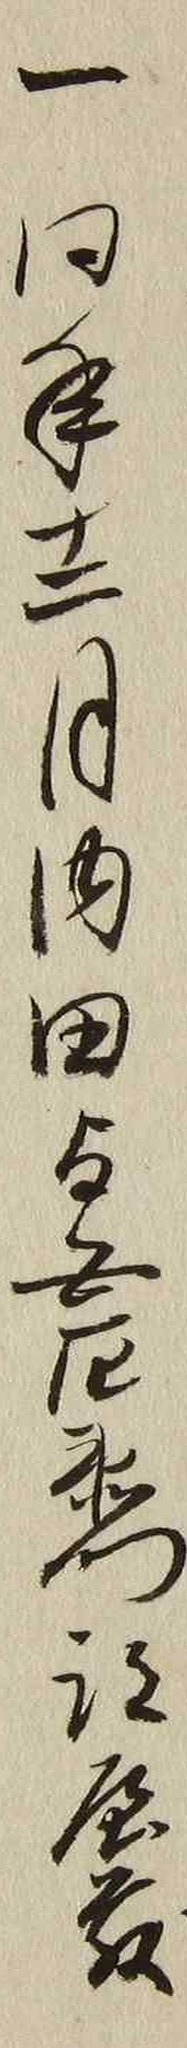一同年十二月内田与五左衛門跡屋敷
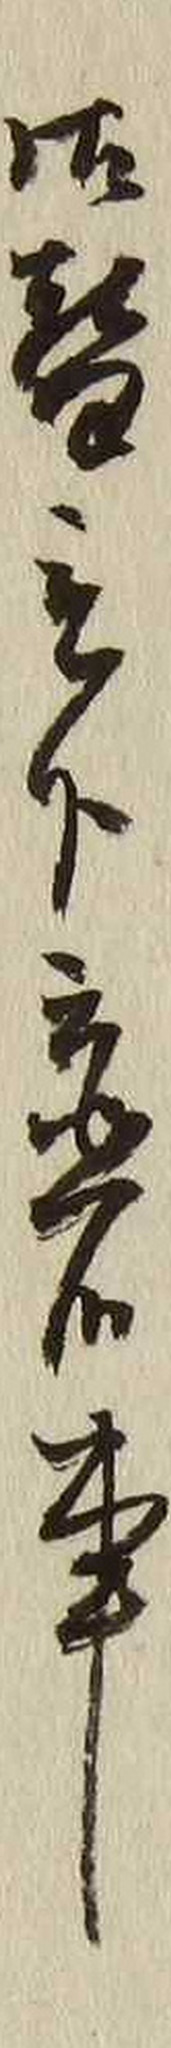御替被下置候事
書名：諸士系譜　巻之349　も之部5
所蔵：会津若松市立会津図書館
